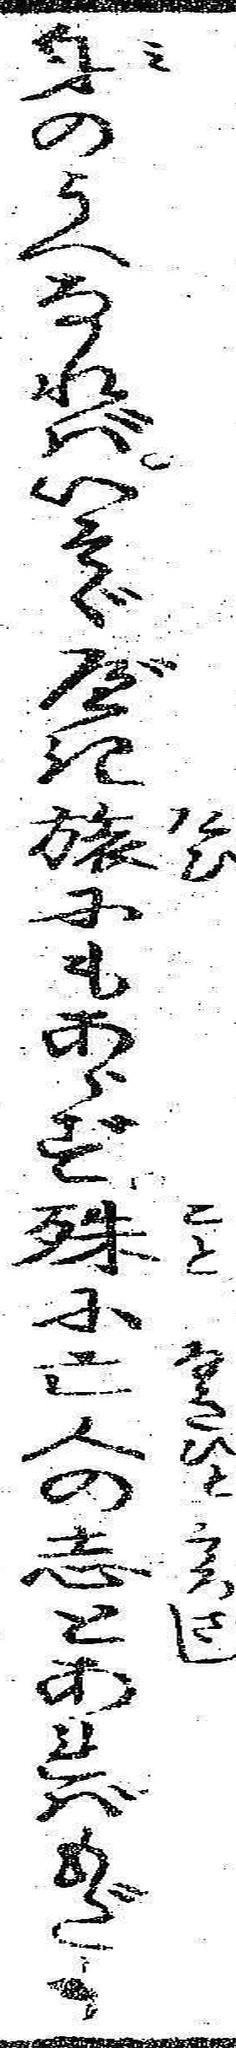身のうへなれば。いそぐべき旅にもあらず。殊に亡人の志とあればもだし
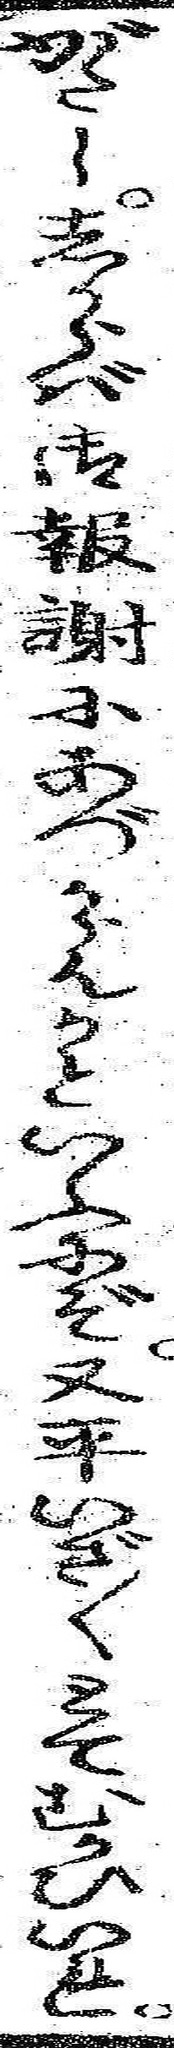がたし。しからば御報謝にあづからんかといふにぞ。又平いざ〳〵とてむかひいれ。
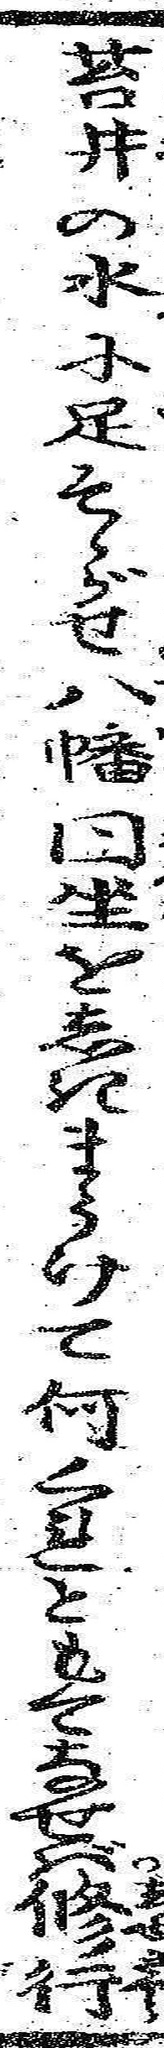苔井の水に足そゝがせ。八幡円坐をしきまうけて何くれともてなせば。修行
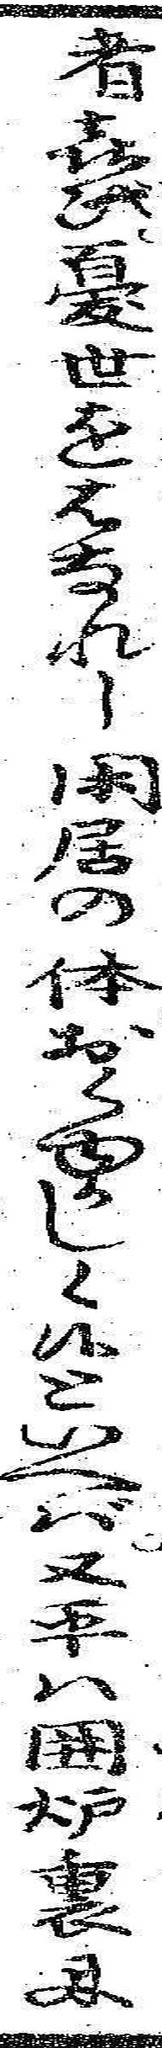者喜び。憂世をはなれし閑居の体。おくゆかしく候といへば。又平は囲炉裏に
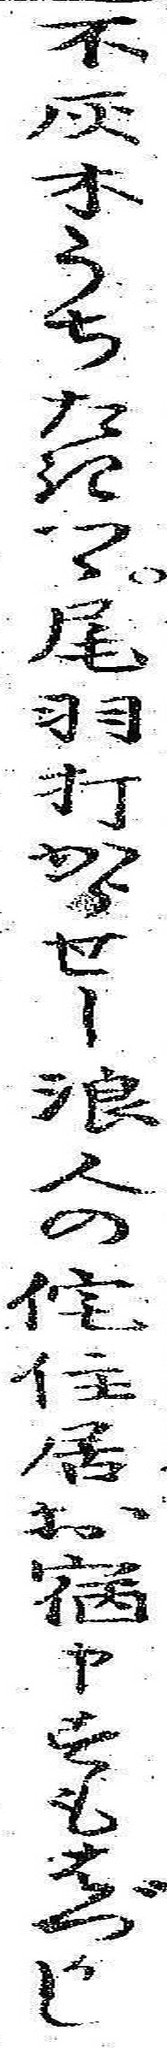不灰木うちたきつゝ。尾羽打からせし浪人の侘住居。お宿申すもはづかし
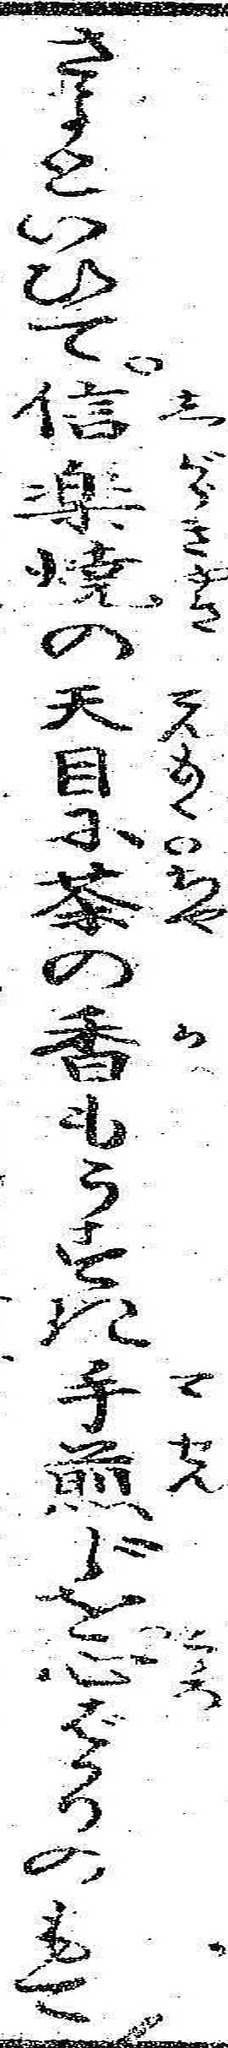さよといひて。信楽焼の天目に。茶の香もうすき手煎じを。心ばかりのもて
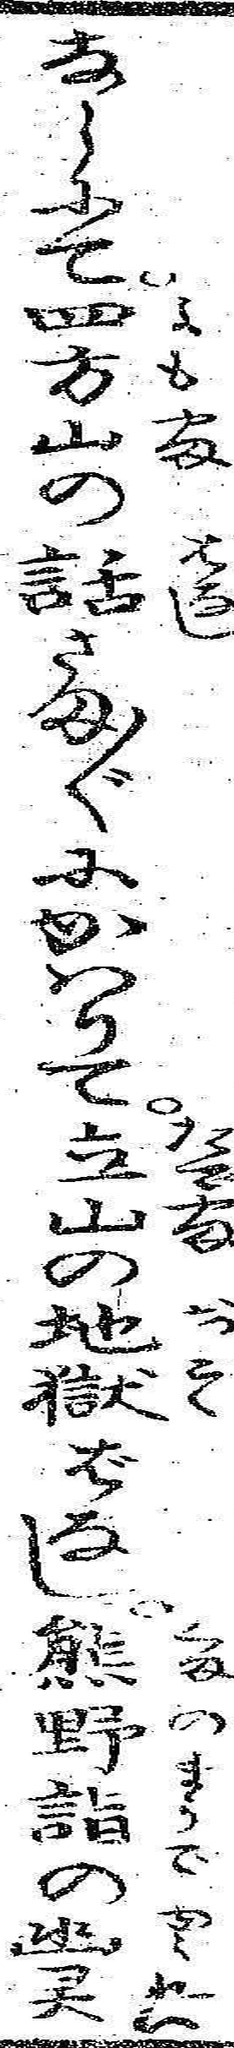なしにて。四方山の話さま〴〵にかはりて。立山の地獄ばなし。熊野詣の幽霊
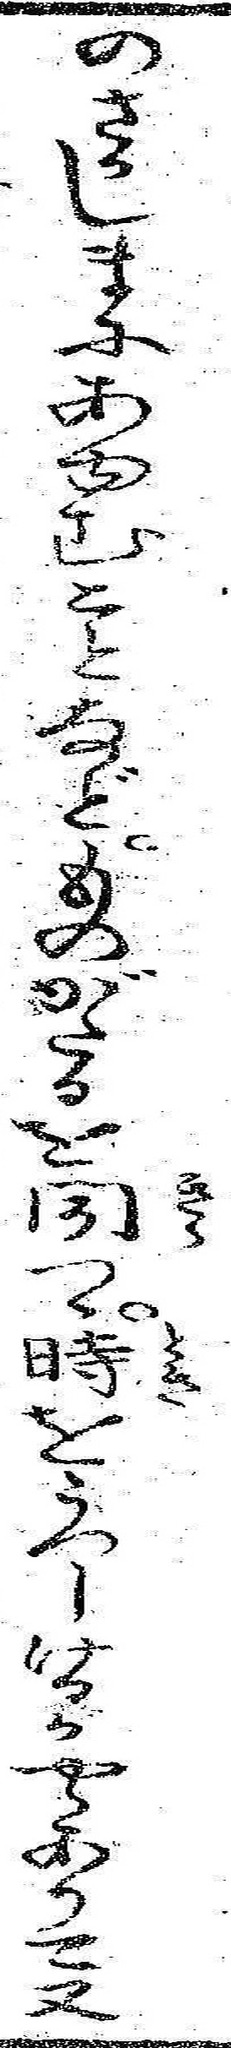のさかしまにあゆむことなど。ものがたるを聞つゝ。時をうつしけるがやゝありて又
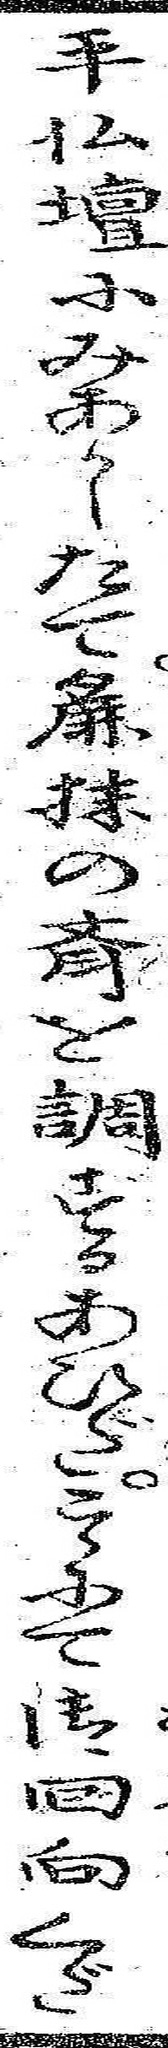平仏壇にみあかしたて。麁抹の斉を調ずるあひだ。こゝにて御回向くだ
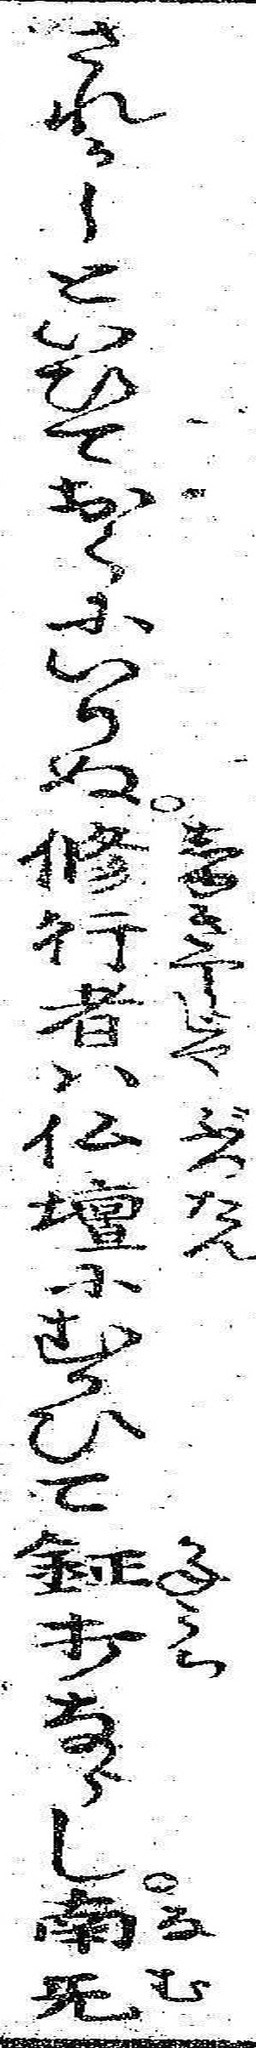されかしといひておくにいりぬ。修行者は仏壇にむかひて鉦打ならし。南無
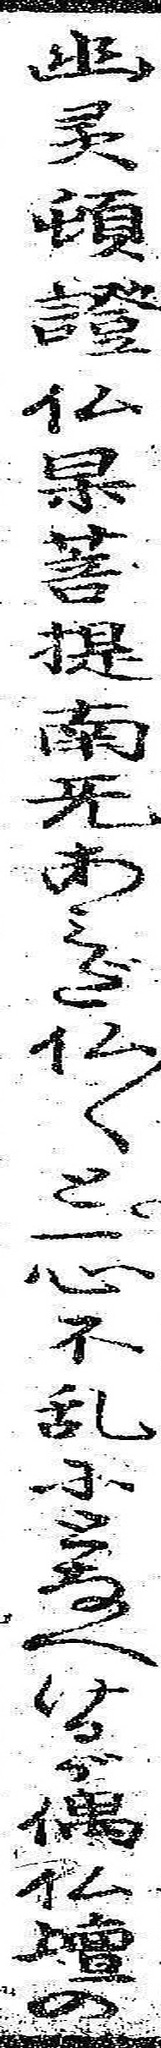幽霊頓証仏果菩提南無あみだ仏〳〵と。一心不乱にとなへけるが偶仏壇の
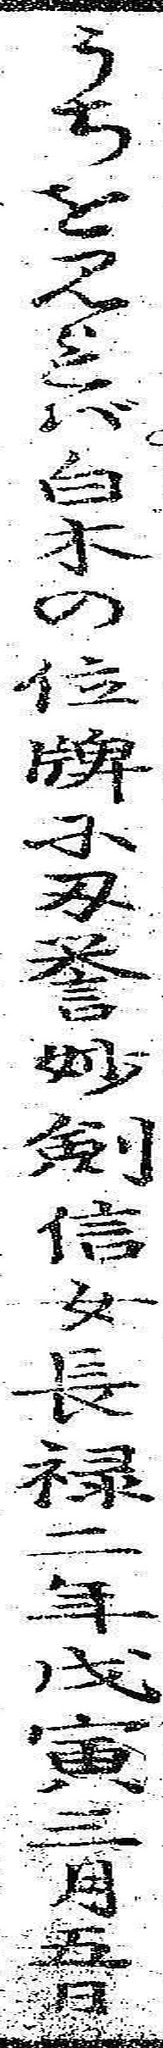うちを見れば。白木の位牌に刃誉妙剣信女長禄二年戌寅三月五日
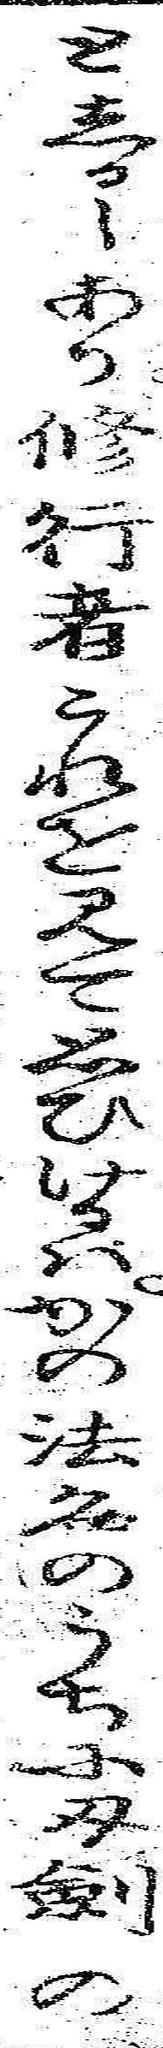としるしあり。修行者これを見て思ひけるは。かの法名のうちに刃剣の

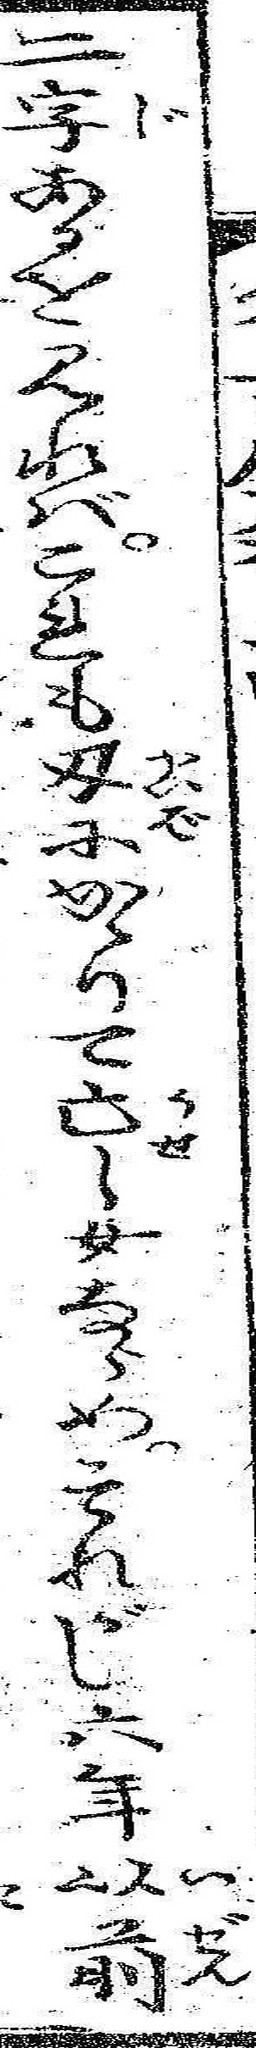二字あるを見れば。これも刃にかゝりて亡し女ならめ。それがし六年以前
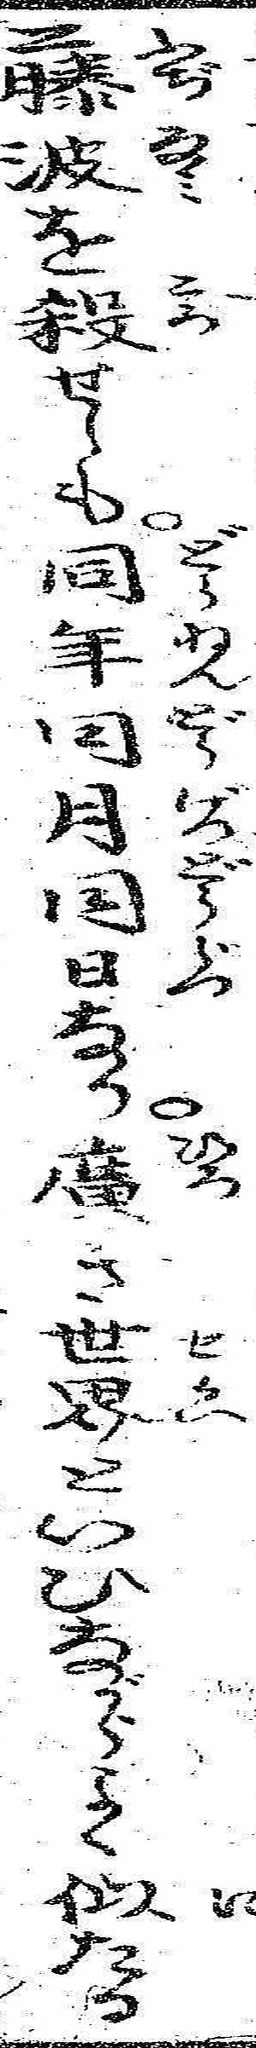藤波を殺せしも。同年同月同日なり。広き世界といひながらよく似たる
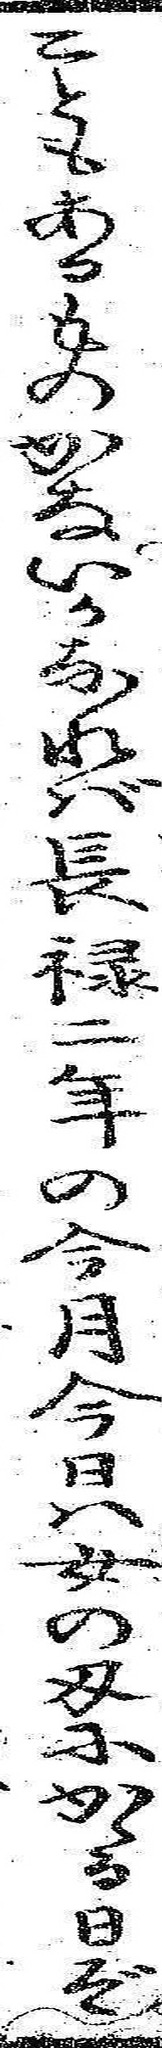こともあるものかな。いかなれば長禄二年の今月今日は。女の刃にかゝる日ぞ。
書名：昔話稲妻表紙
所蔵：国文学研究資料館
